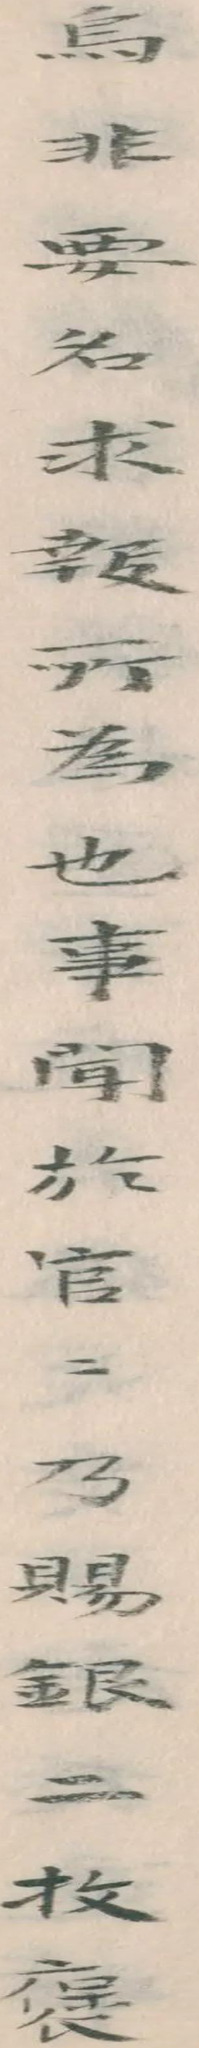烏非要名求報所為也事聞於官に乃賜銀二枚褒
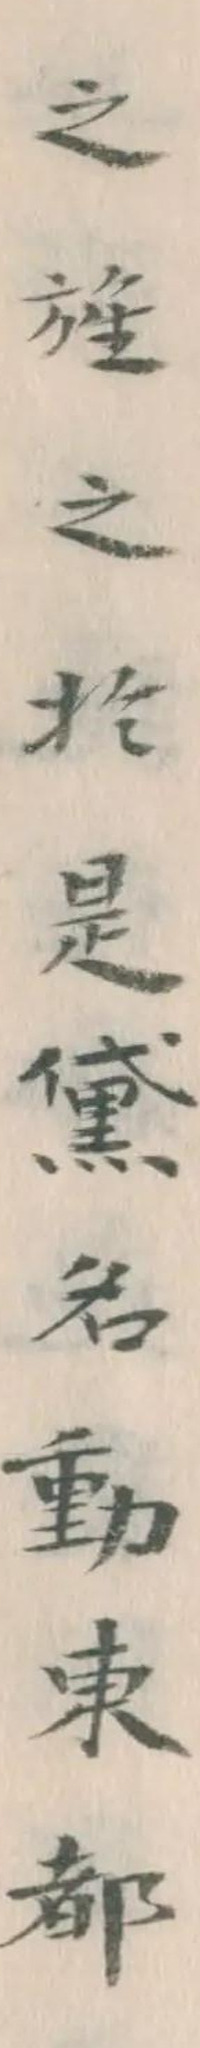之旌之扵是黛名動東都

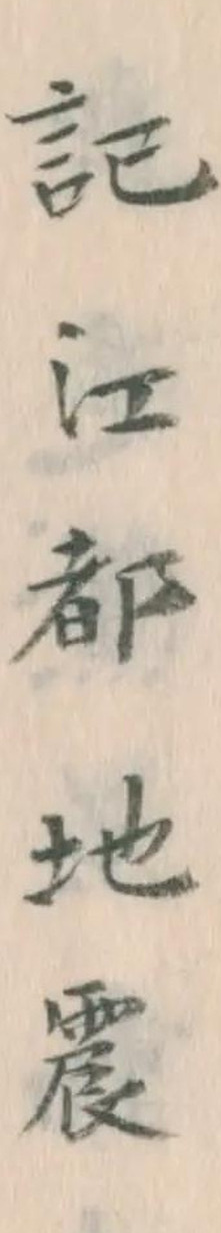記江都地震
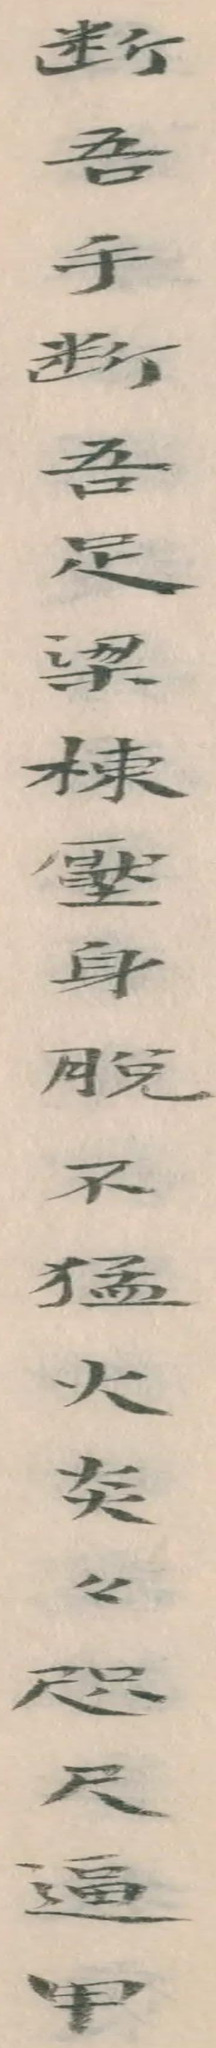断吾手断吾足梁棟壓身脱不猛火炎々咫尺逼甲
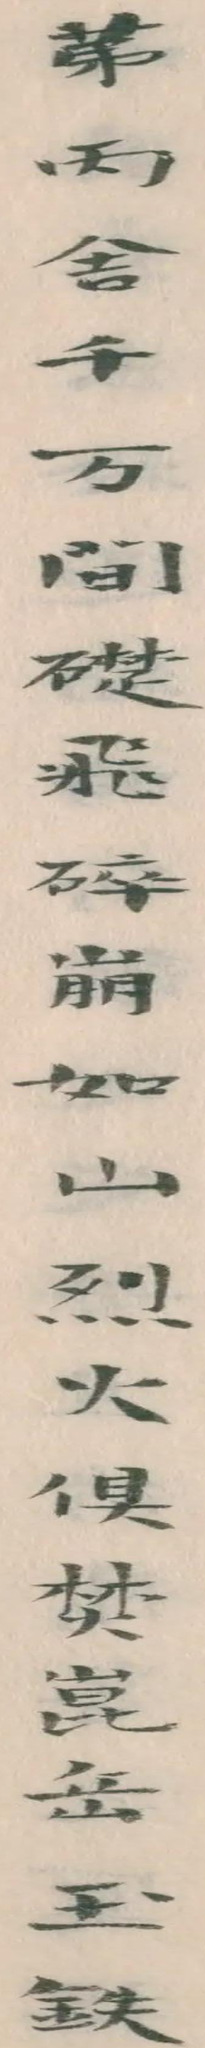苐丙舍千万間礎飛碎崩如山烈火俱焚崑岳玉鉄
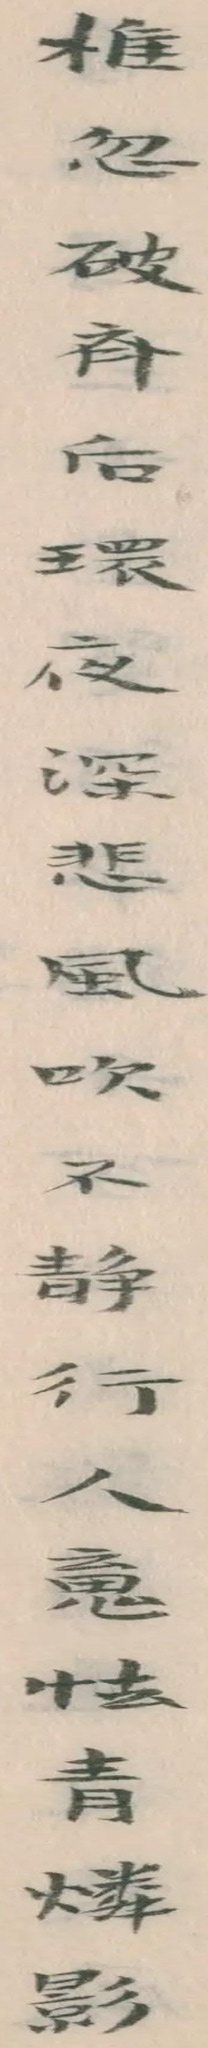椎忽破斉后環夜深悲風吹不静行人䰟怯青燐影
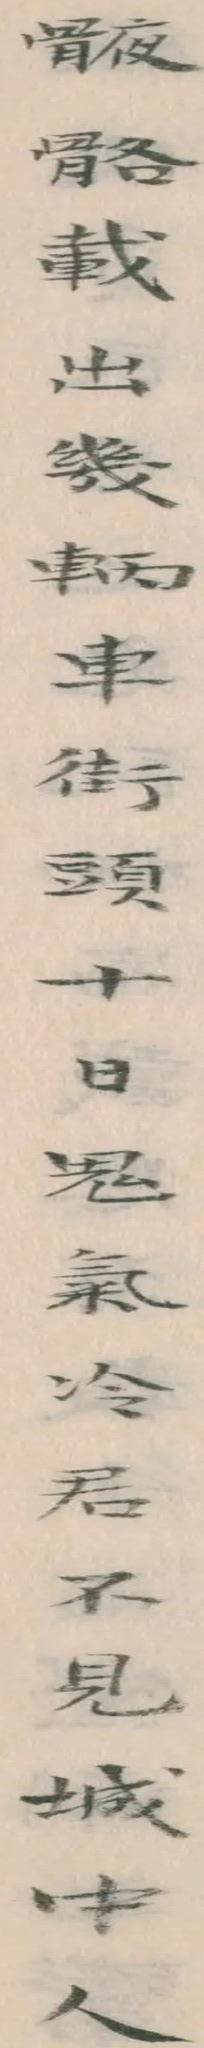骼載出幾輀車街頭十日鬼氣冷君不見城中人
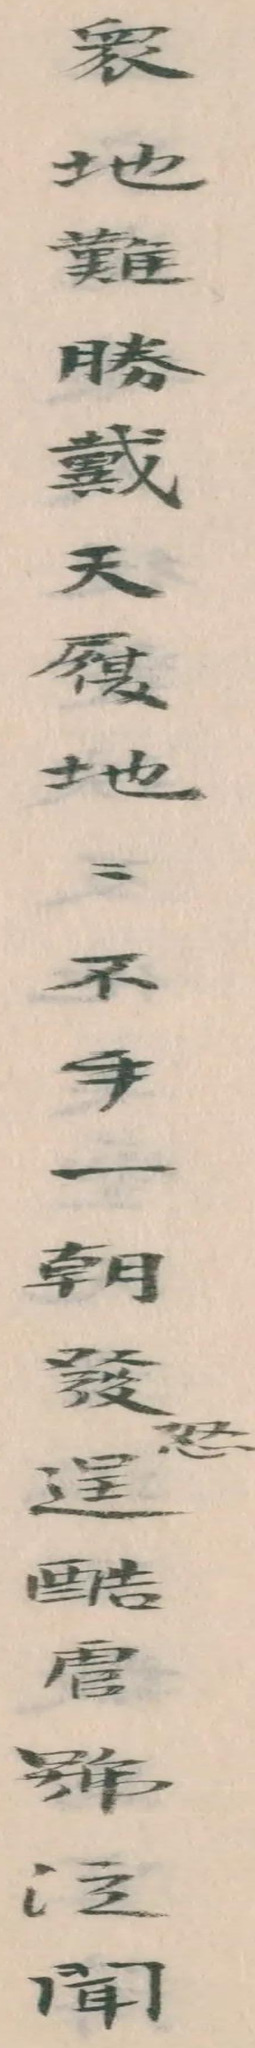衆地難勝戴天履地ニ不手一朝發怒逞酷虐泣聞
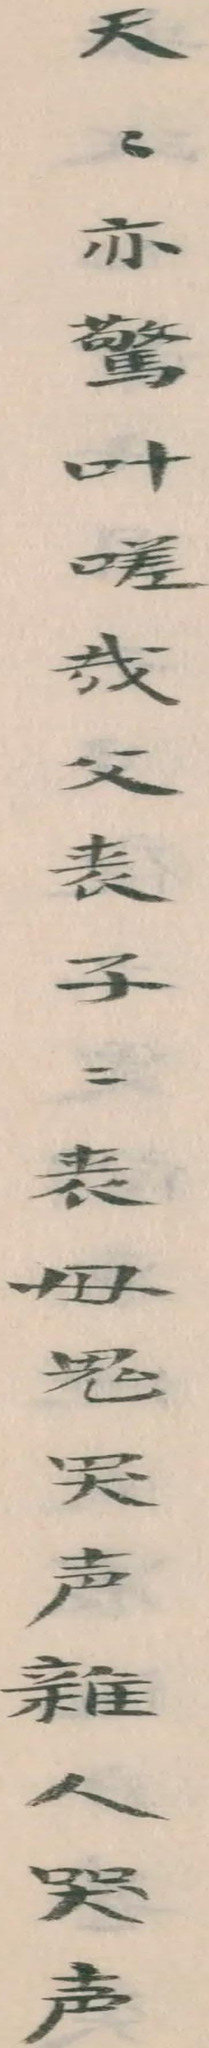天々亦驚叶嗟哉父表子に表母鬼哭声雜人哭声
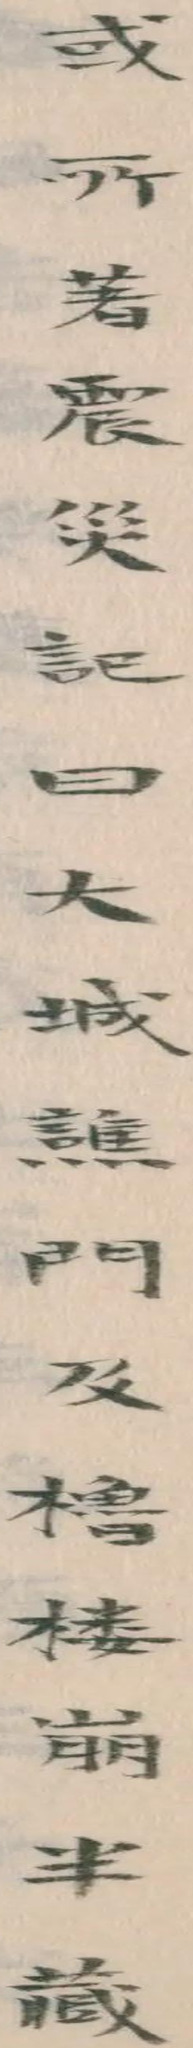或所著震災記曰大城譙門及櫓楼崩半藏
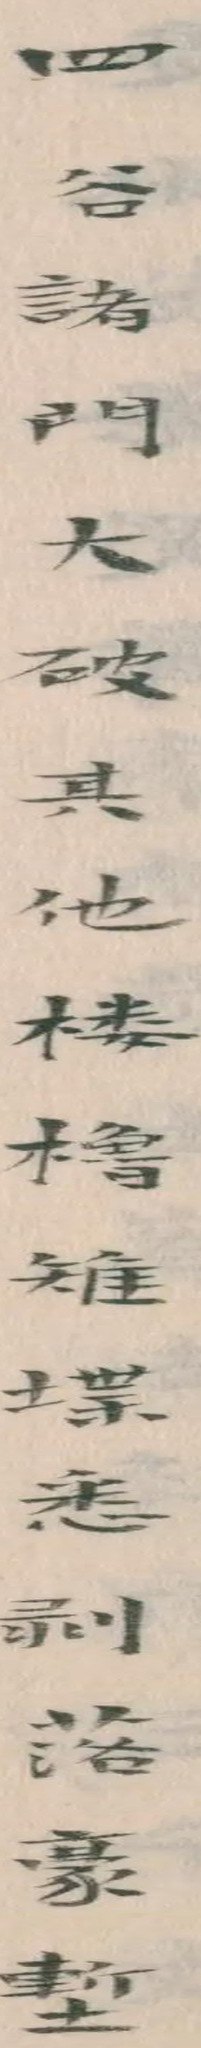四谷諸門大破其他楼櫓雉堞悉剥落豪塹
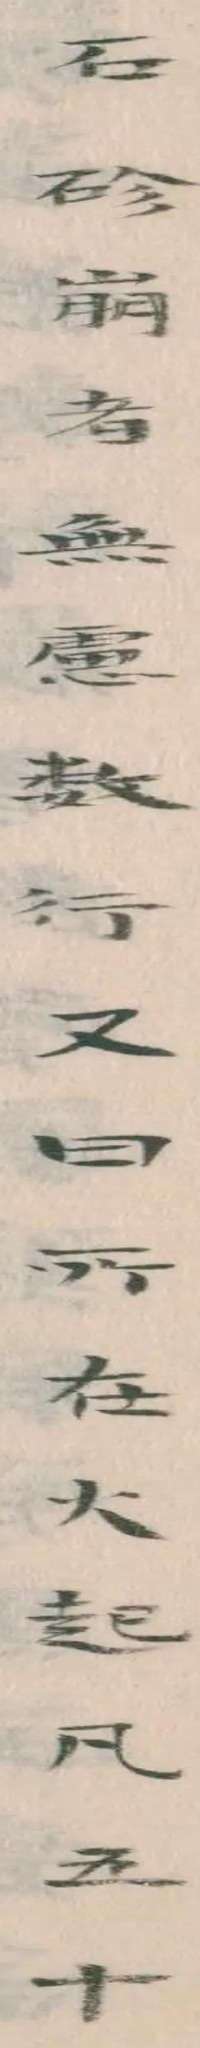石䂦崩者無慮数行又曰所在火起凡五十
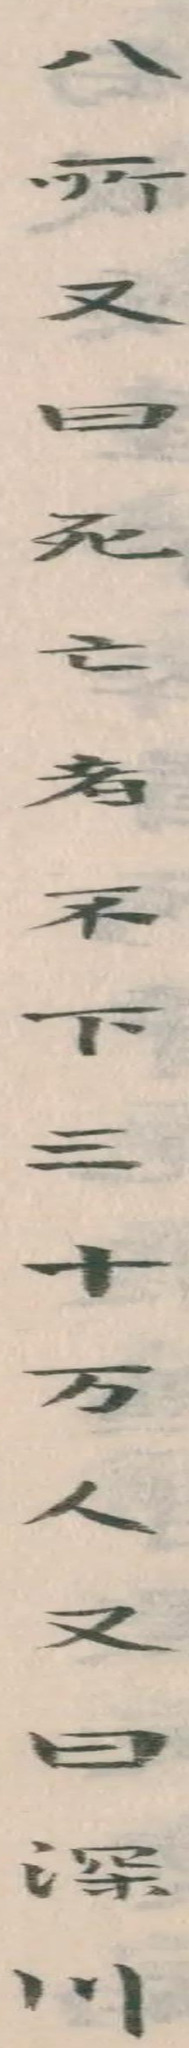八所又曰死亡者不下三十万人又曰深川
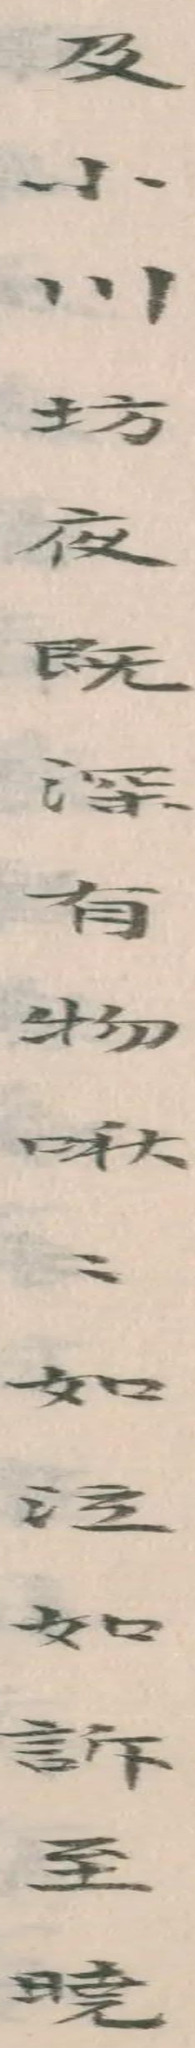及小川坊夜既深有物啾々如泣如訴至暁
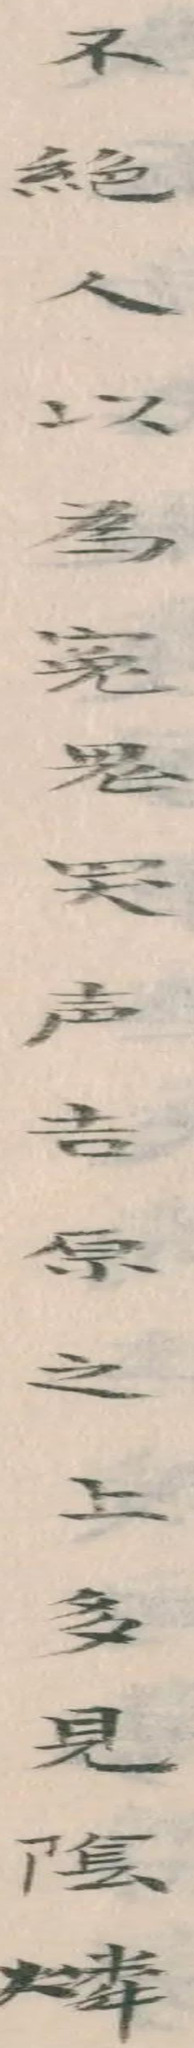不絶人以為寃鬼哭声吉原之上多見陰燐
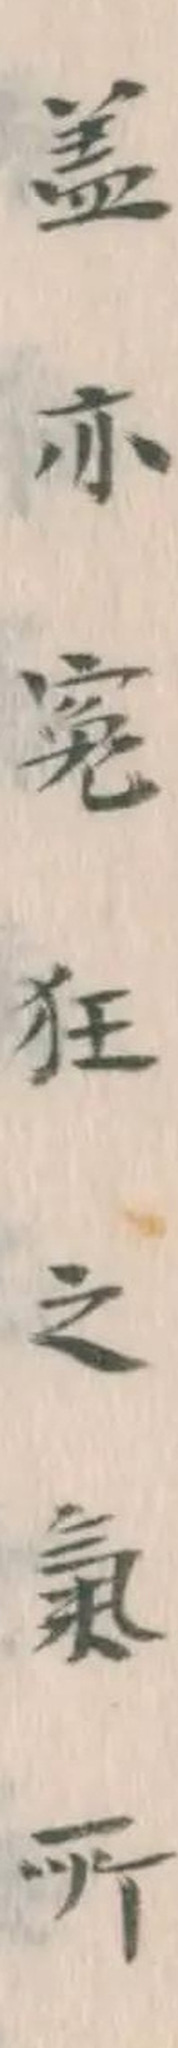盖亦寃狂之氣所
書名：地災撮要. 巻11-12(地震之部)
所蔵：国立国会図書館 National Diet Library, JAPAN
